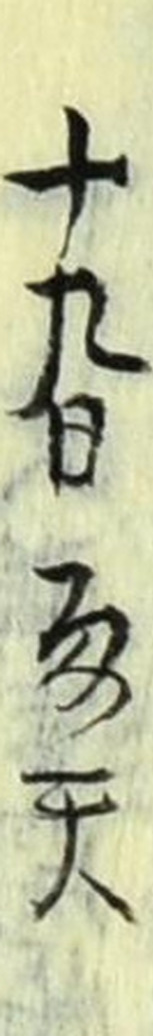十九日雨天
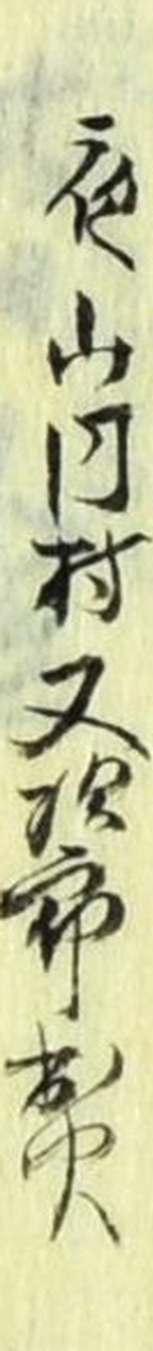夜山内村又次郎出火
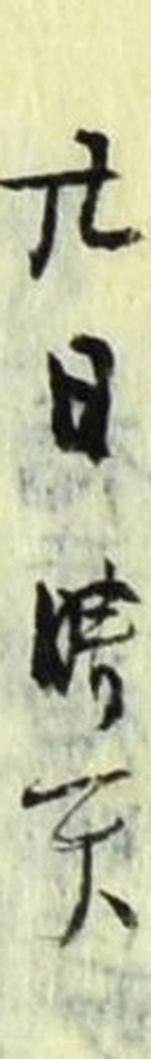廿日晴天
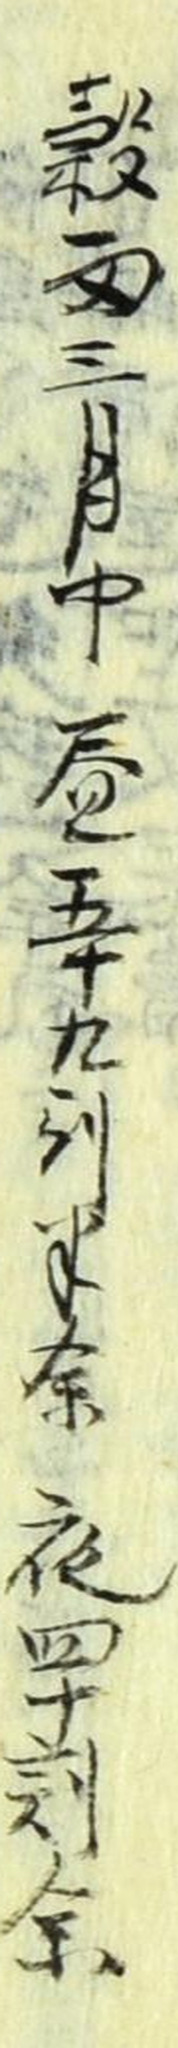穀雨三月中昼五十九刻半余夜四十刻余
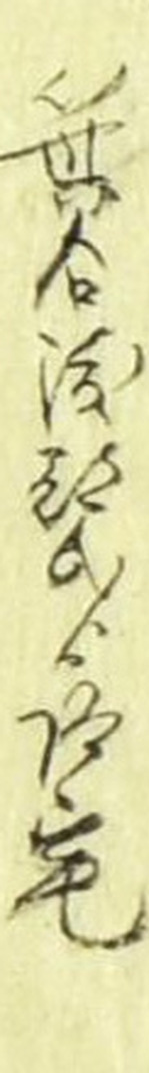笹谷渡部氏ゟ帰宅

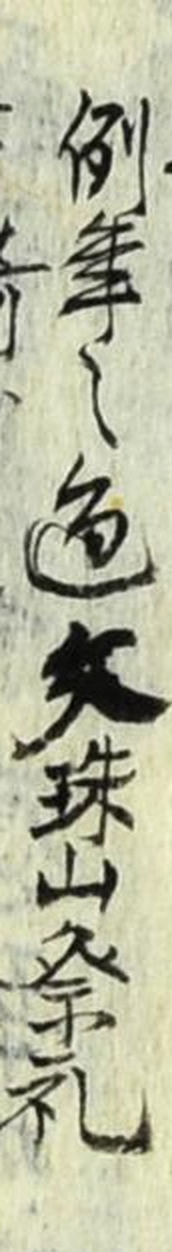例年之通文殊山祭礼
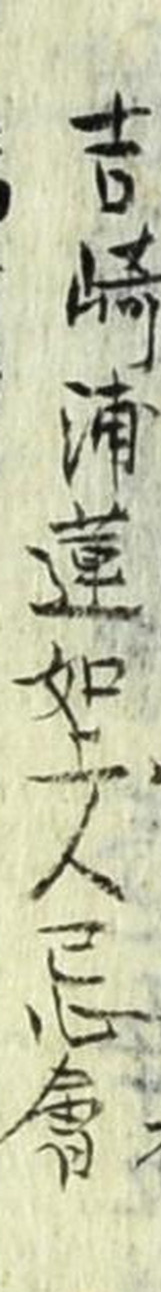吉崎浦蓮如上人忌会
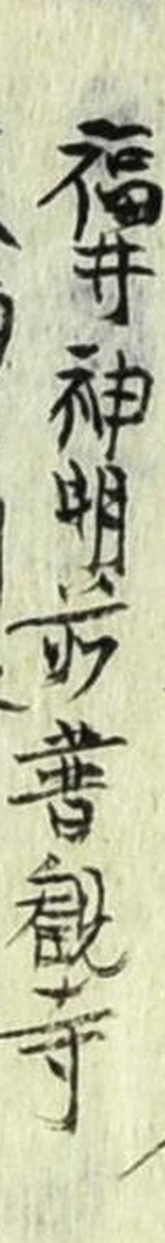福井神明前普観寺
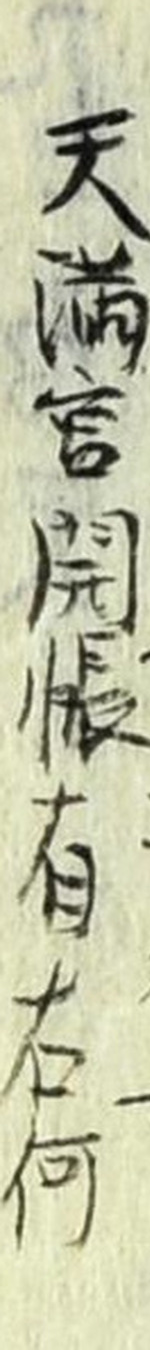天満宮開帳有右何
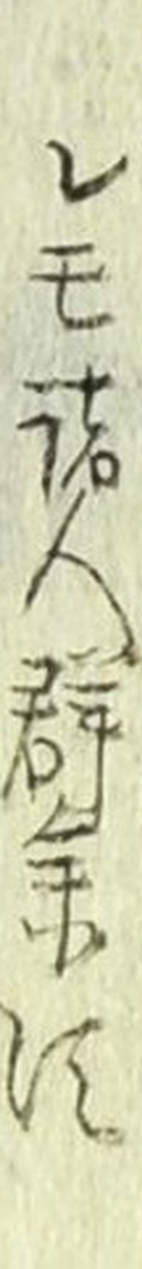レモ諸人群余す
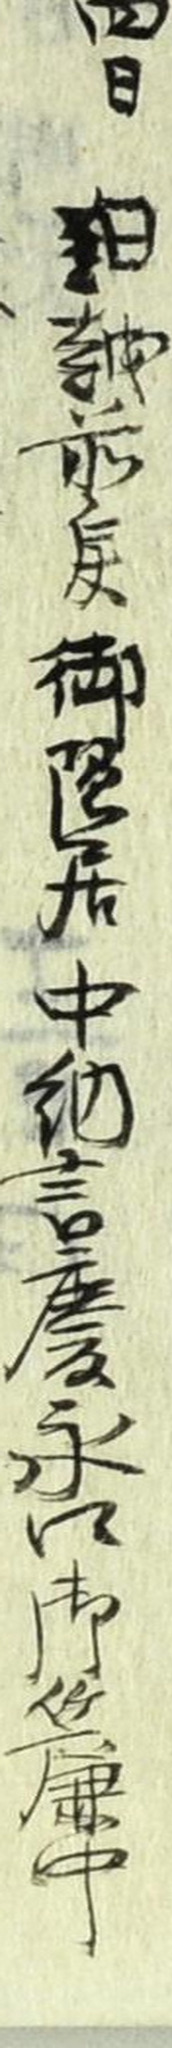廿四日旧越前侯御隠居中納言慶永卿御簾中
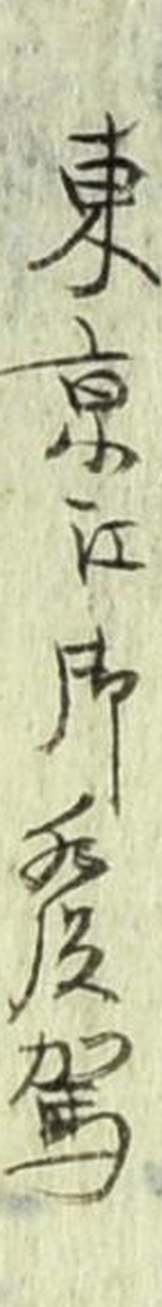東京江御発駕

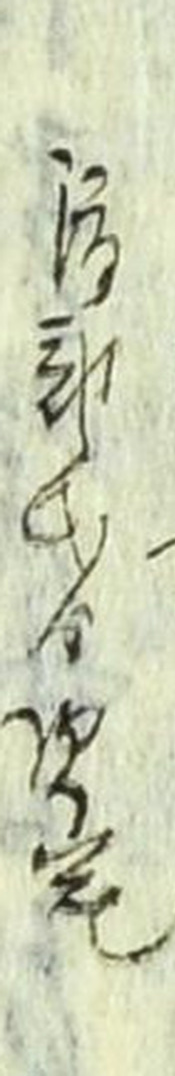渡部氏ゟ帰宅
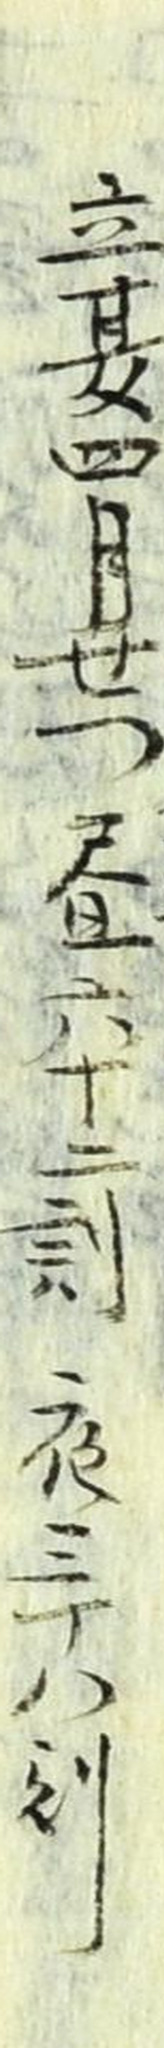立夏四月せつ昼六十二刻夜三十八刻
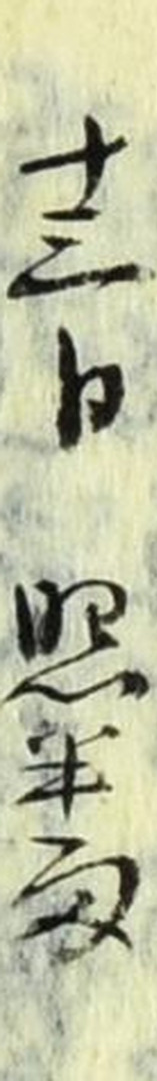十三日照半雨
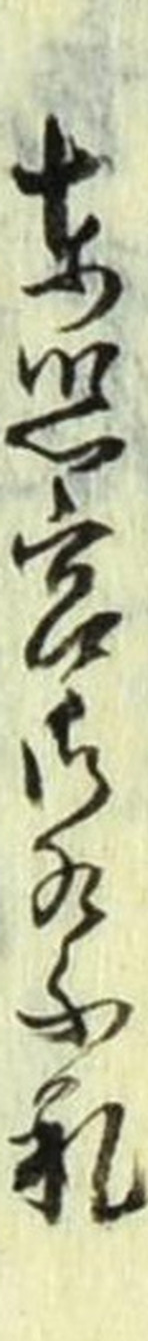東照宮御祭礼
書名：（日記）
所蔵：福井県文書館 Fukui Prefectural Archives
